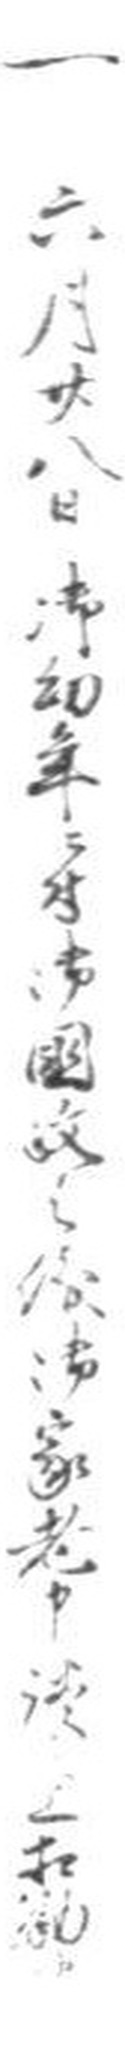一六月廿八日御幼年ニ付御国政之儀御家老申談之上相勤候
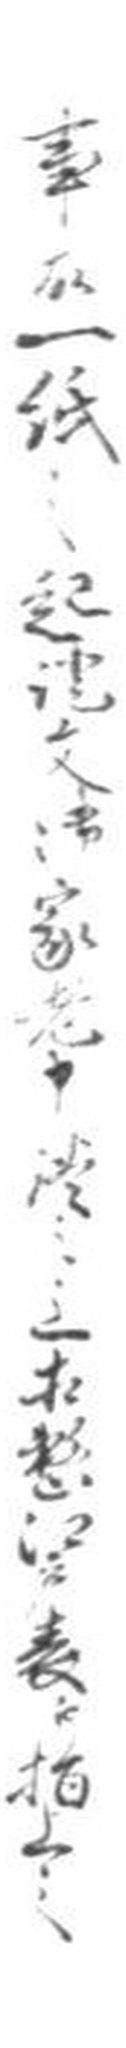事故一紙之起証文御家老申談之上相整江戸表江指上之
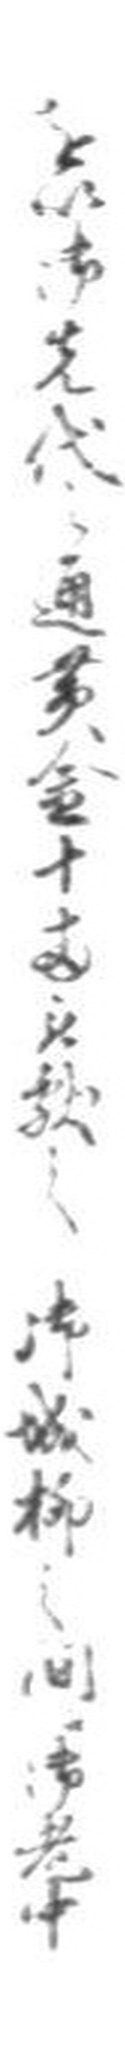を以御先代之通黄金十両被献之御城柳之間江御老中
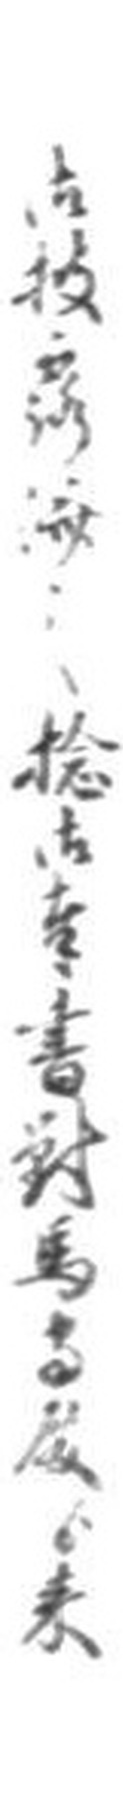御披露済之捻御奉書対馬守殿ゟ来
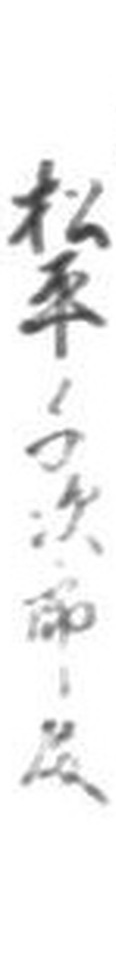松平千次郎殿重行
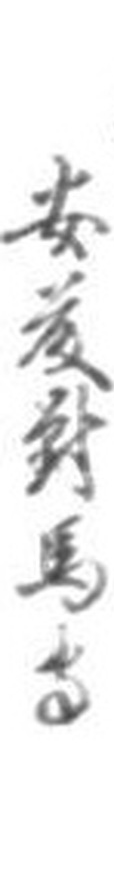安藤対馬守
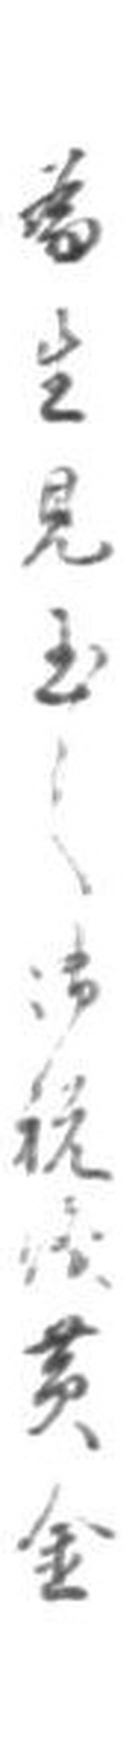為生見玉之御祝儀黄金
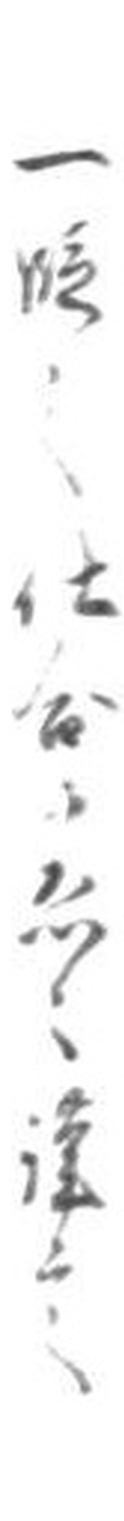一段之仕合候恐々謹言

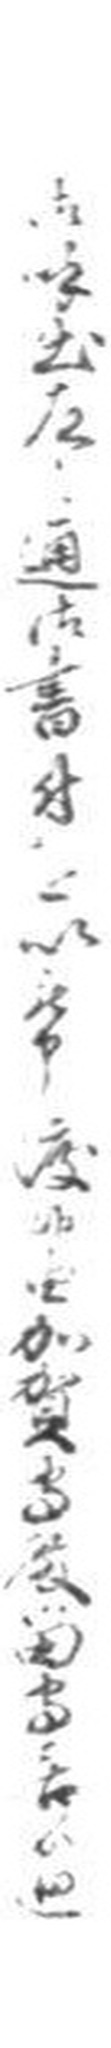御呼出左之通御書付を以被申渡候由加賀守殿留守居ゟ廻
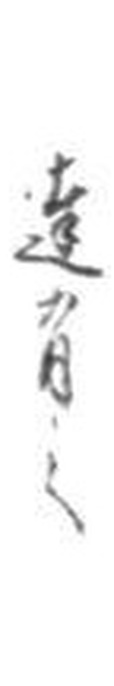達有之
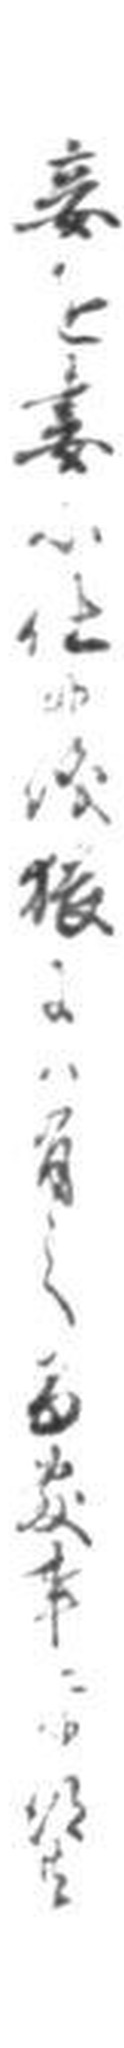妾を妻に仕候儀猥にハ有之間敷事ニ候得共
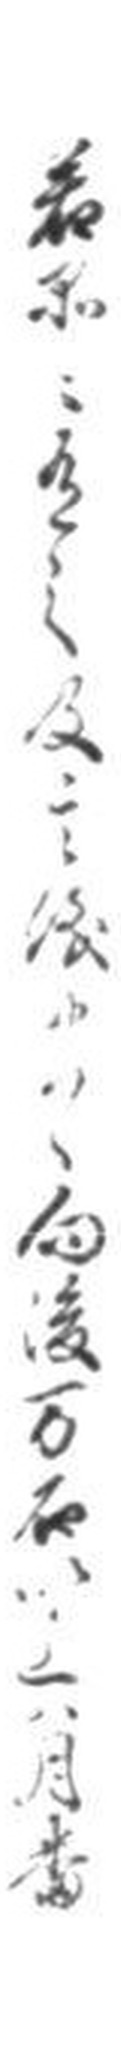若品々有之及其儀候ハヽ向後万石以上ハ月番
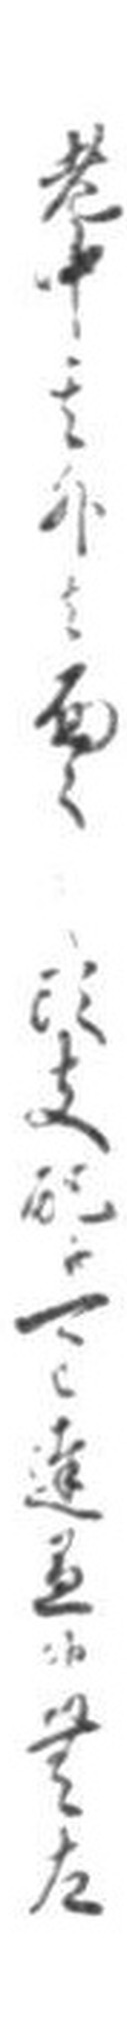老中其外者面々之頭支配江可被達置候無左
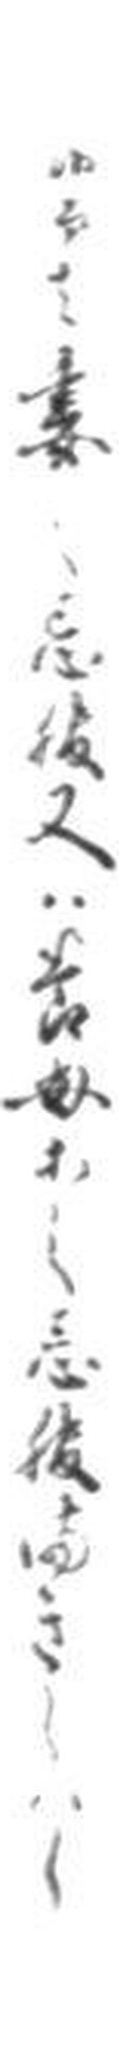候而者妻之忌服又ハ養母等之忌服まきらハし
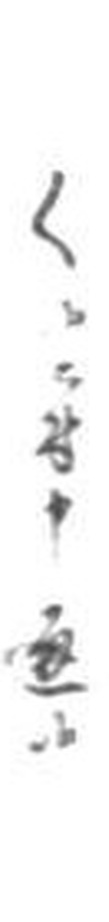く候ニ付申通候
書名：家譜 三十八 宗矩公 従享保九年五月到享保九年十二月
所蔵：福井県文書館 Fukui Prefectural Archives
